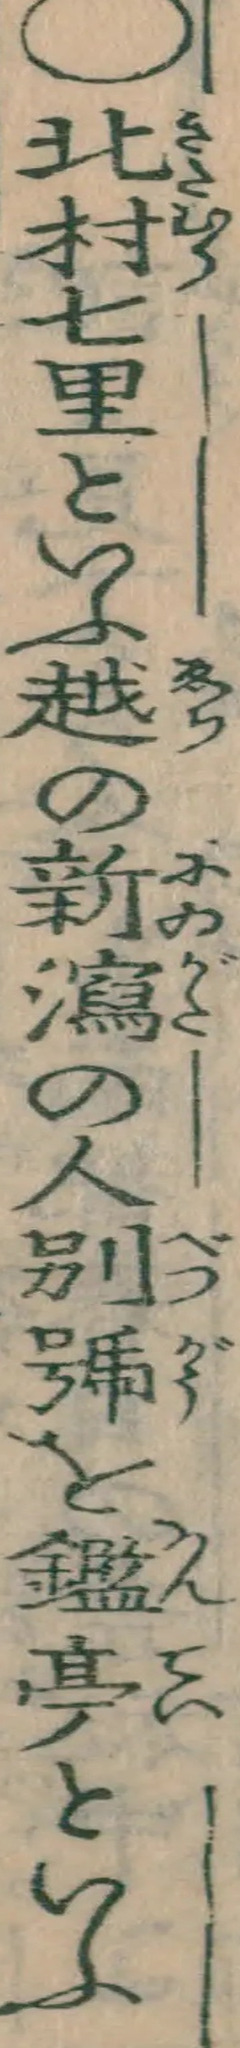○北村七里といふ越の新潟の人別号を鑑亭といふ
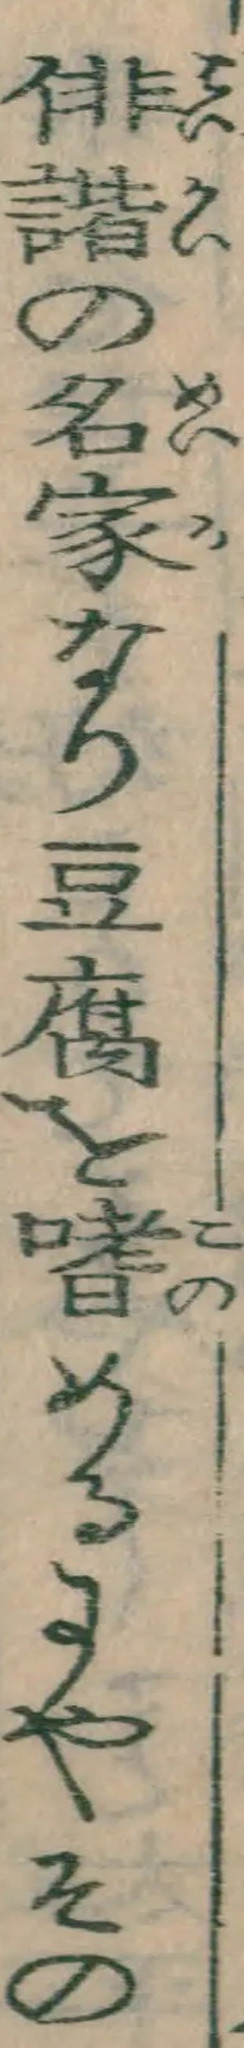俳諧の名家なり豆腐を嗜めるにやその
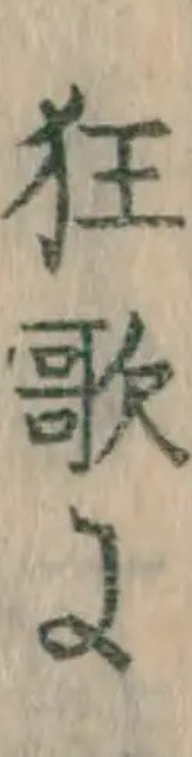狂歌に
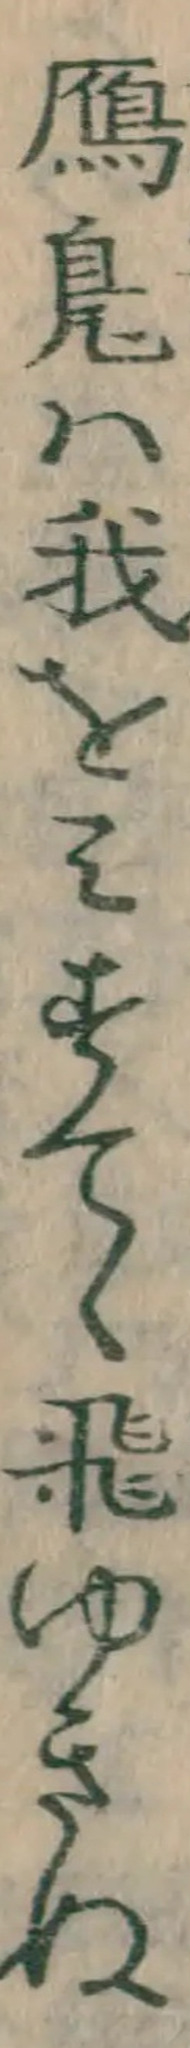雁鳬は我をみすてゝ飛ゆきぬ
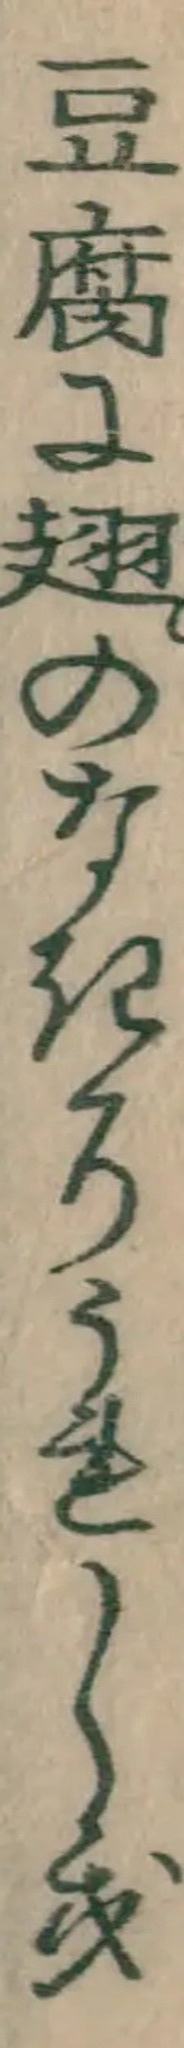豆腐に翅のなきそうれしき

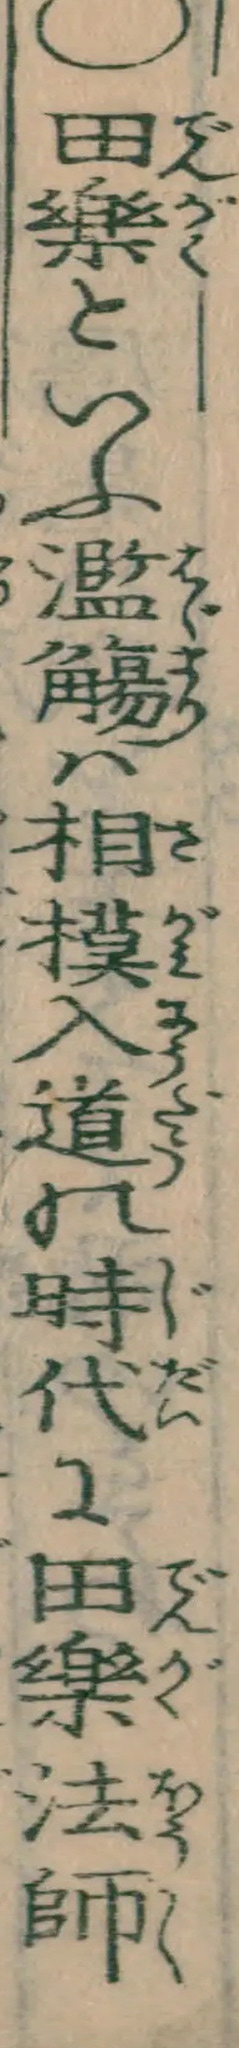○田楽といふ濫觴は相模入道の時代に田楽法師
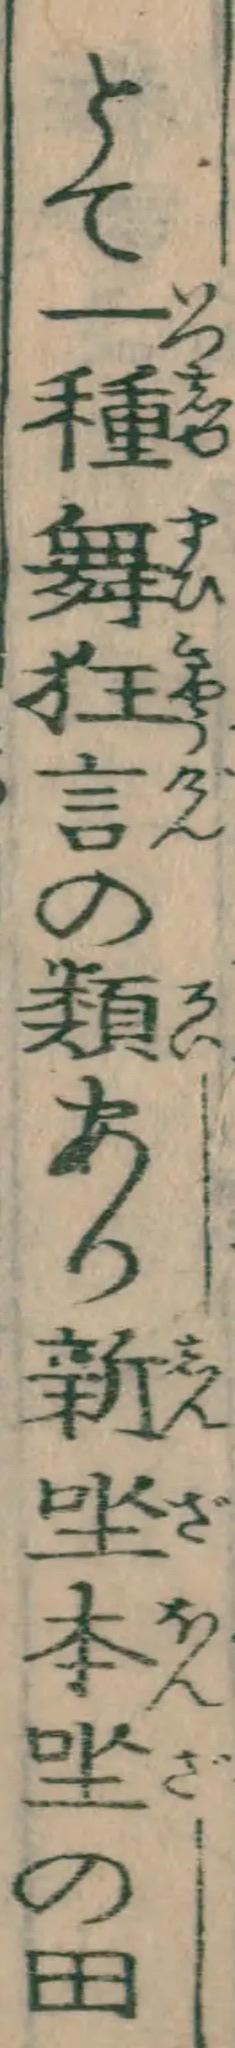とて一種舞狂言の類あり新坐本坐の田
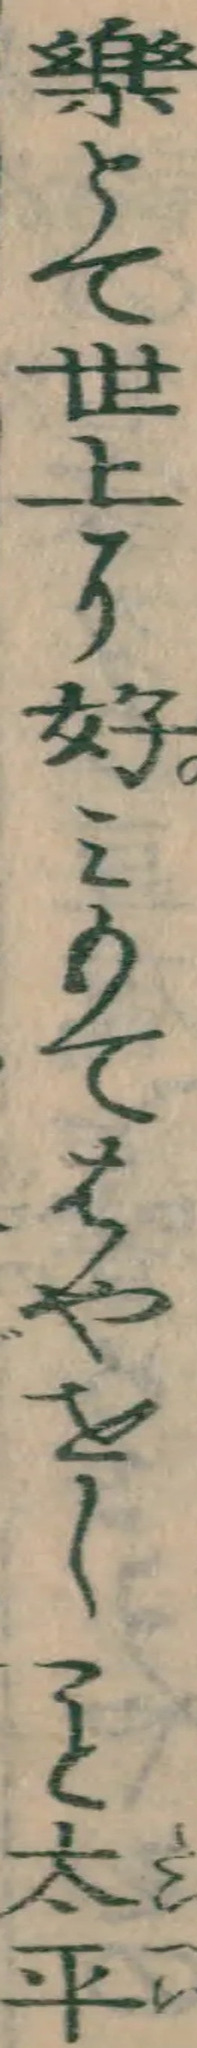楽とて世上に好みもてはやせしこと太平
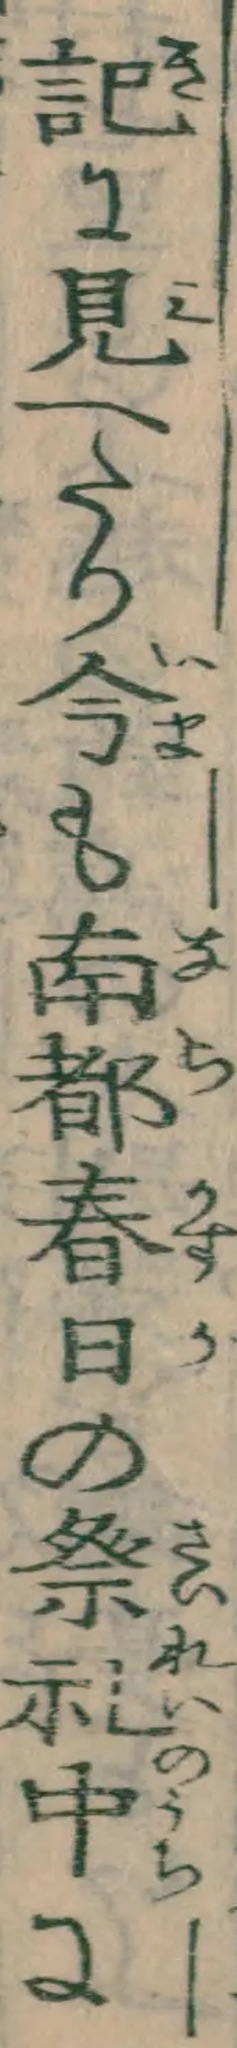記に見へたり今も南都春日の祭礼中に
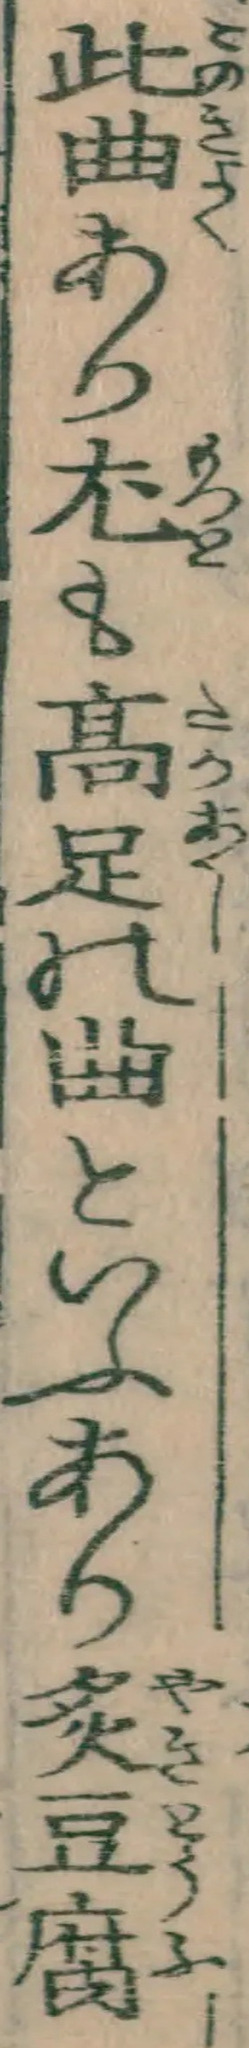此曲あり尤も高足の曲といふあり炙豆腐
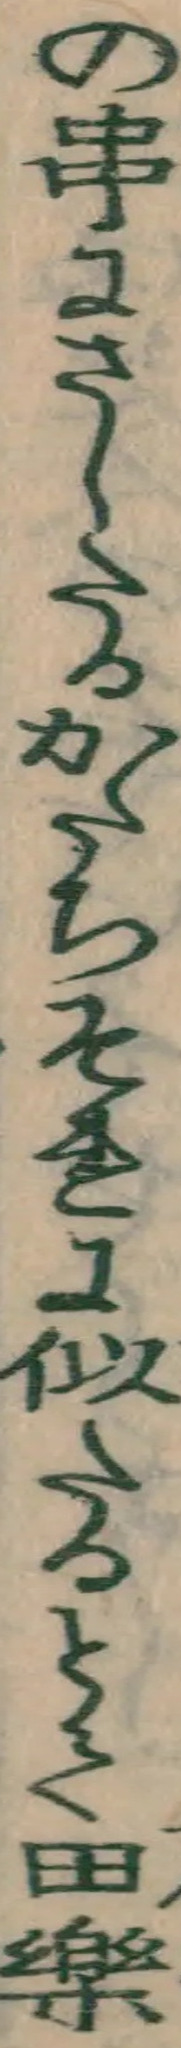の串にさしたるかたちそれに似たるとて田楽
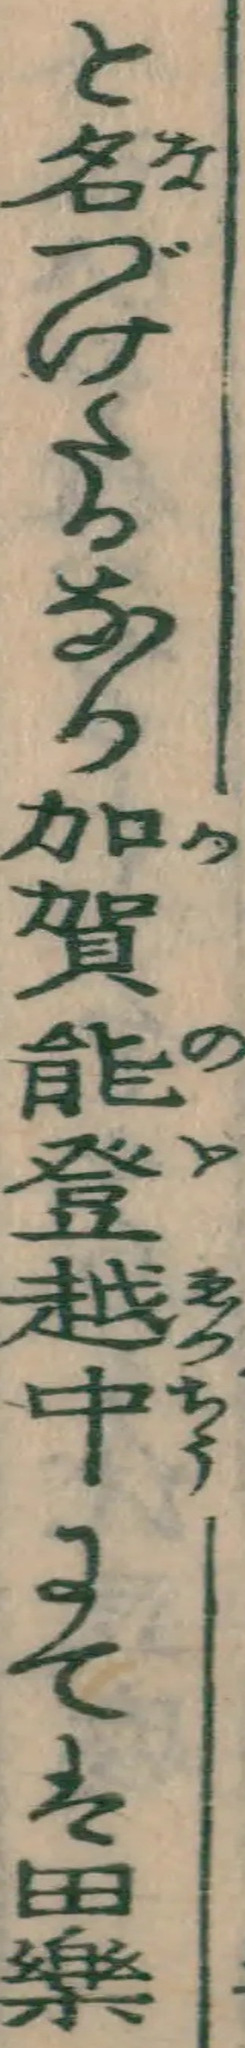と名づけたるなり加賀能登越中にては田楽
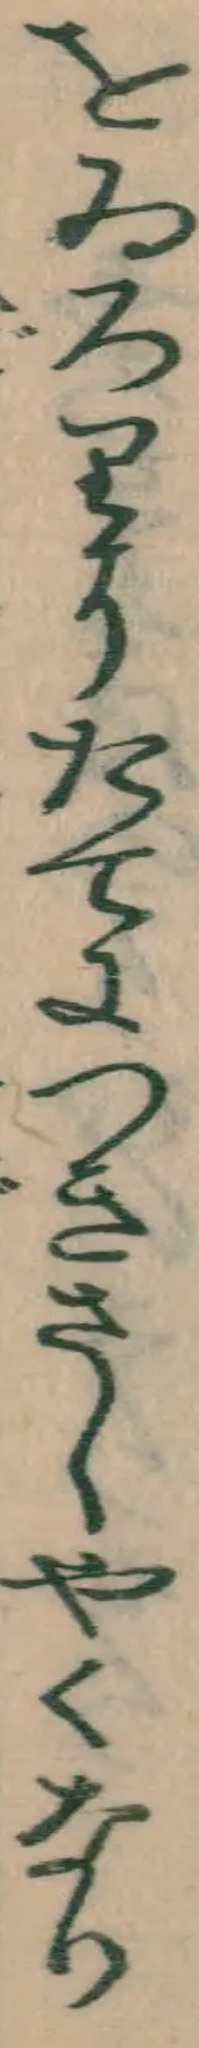をゐろりにたてにつきさしやくなり
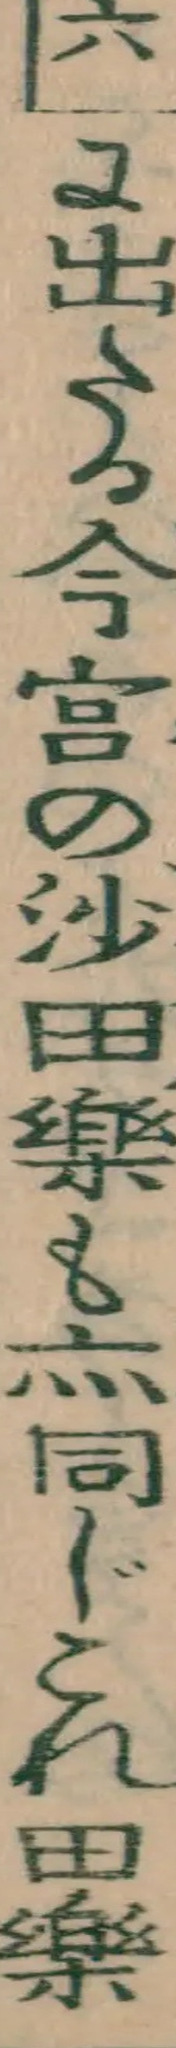六に出たる今宮の沙田楽も亦同じこれ田楽
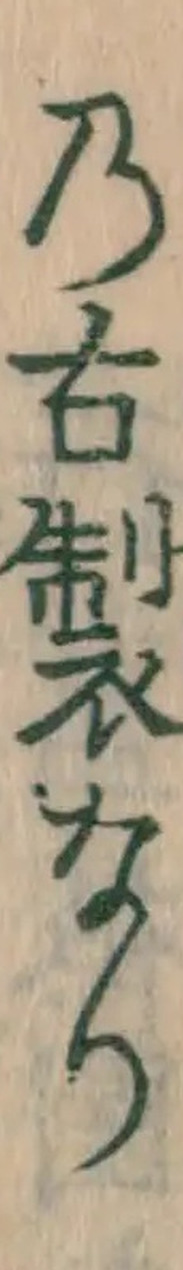の古製なり
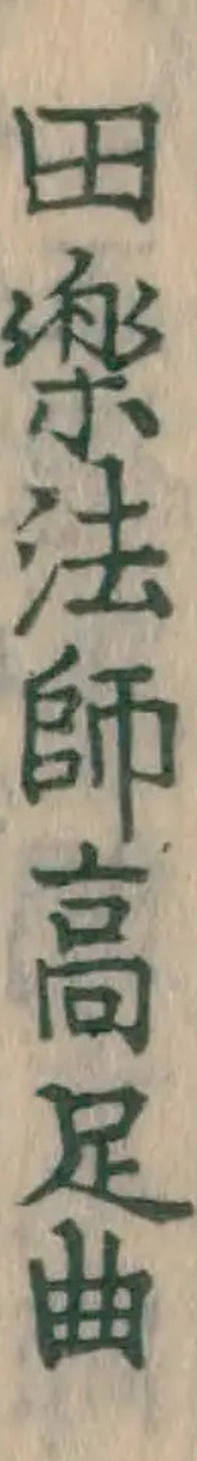田楽法師高足曲
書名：豆腐百珍. 続編
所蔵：国立国会図書館 National Diet Library, JAPAN
